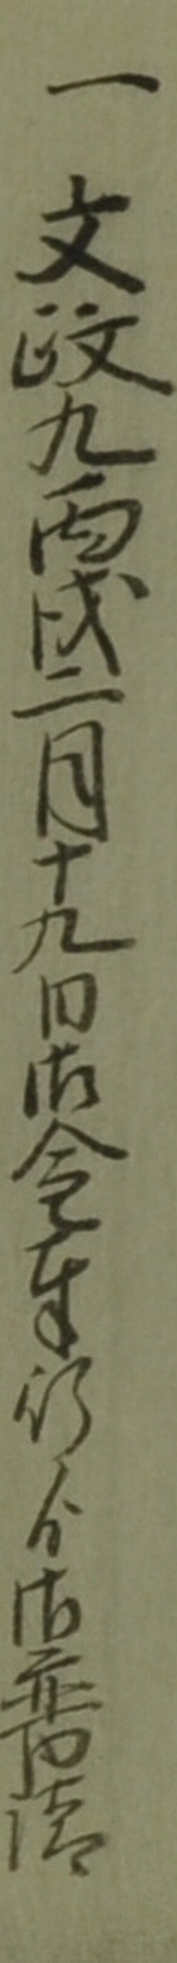一文政九丙戌二月十九日御金奉行ゟ御普請
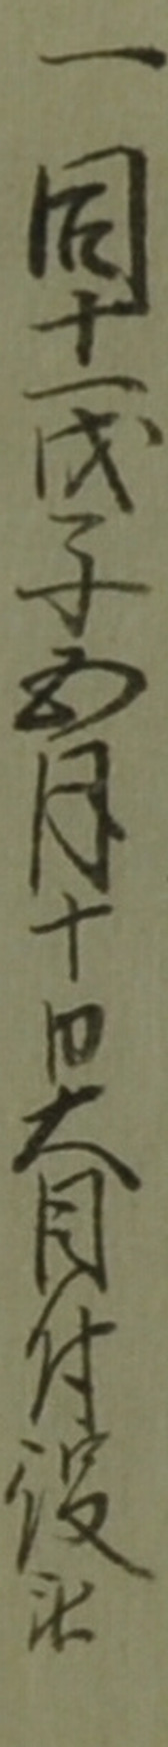一同十一戊子五月十日大目付役被
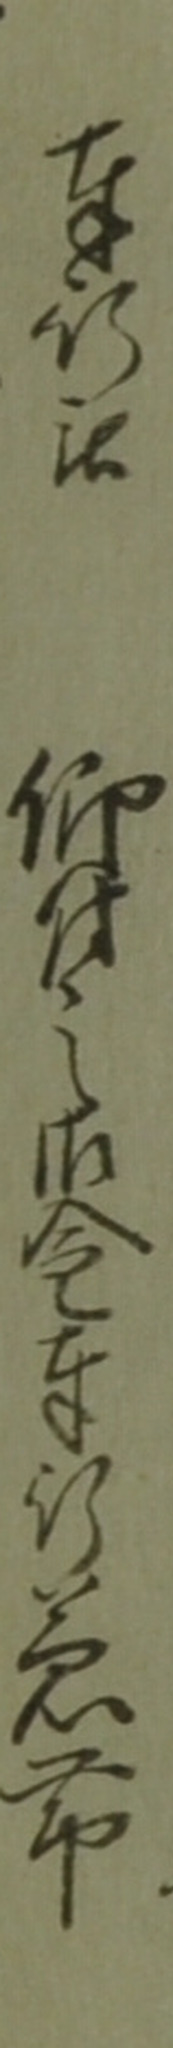奉行被仰付之御金奉行兼帯
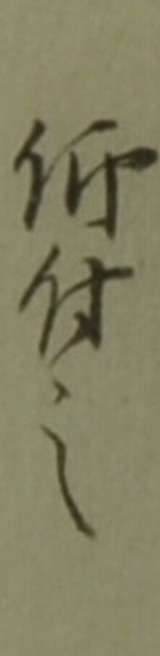仰付之
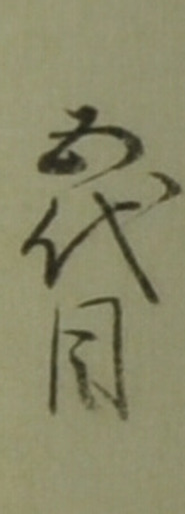五代目

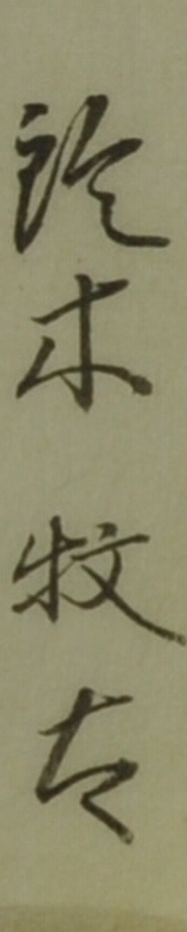鈴木牧太
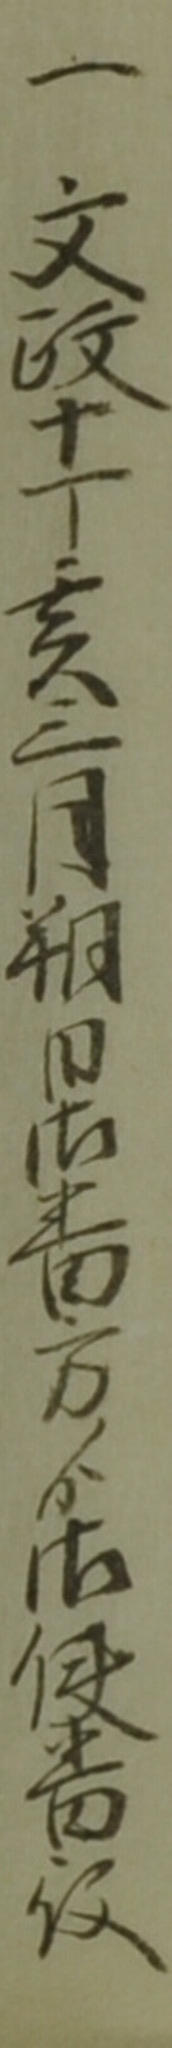一文政十丁亥三月朔日御番方ゟ御使番役
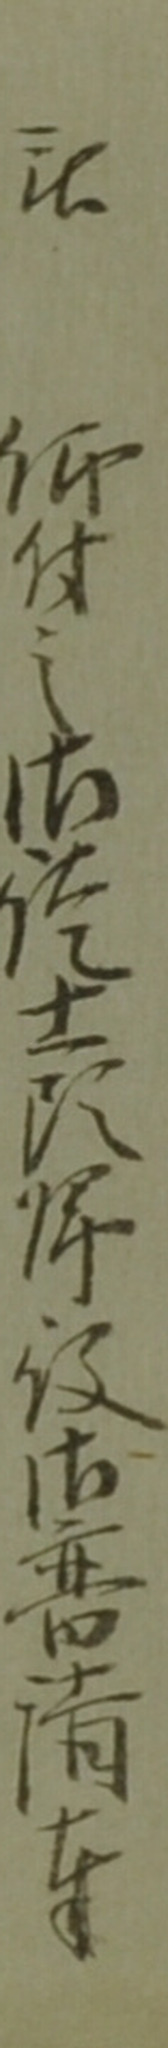被仰付之御徒士頭帰役御普請奉
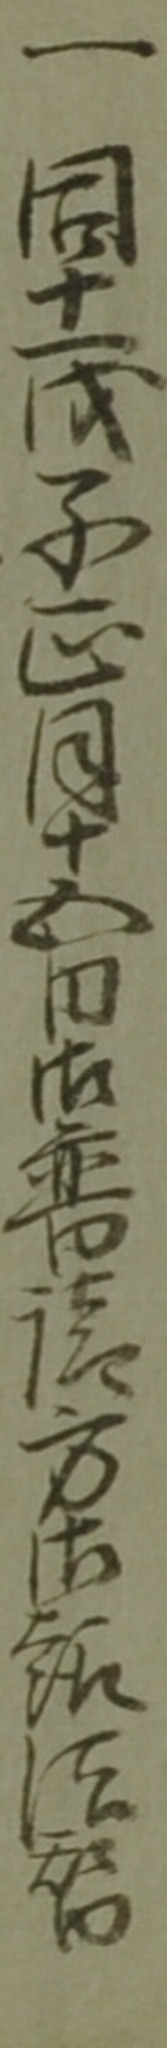一同十一戊子正月十五日御普請方御趣法替
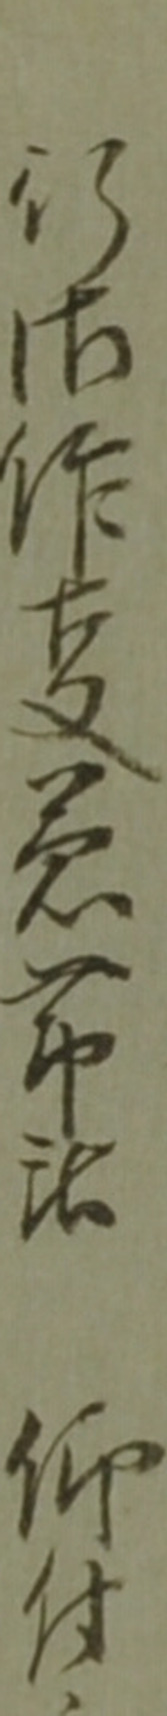行御作事兼帯被仰付之
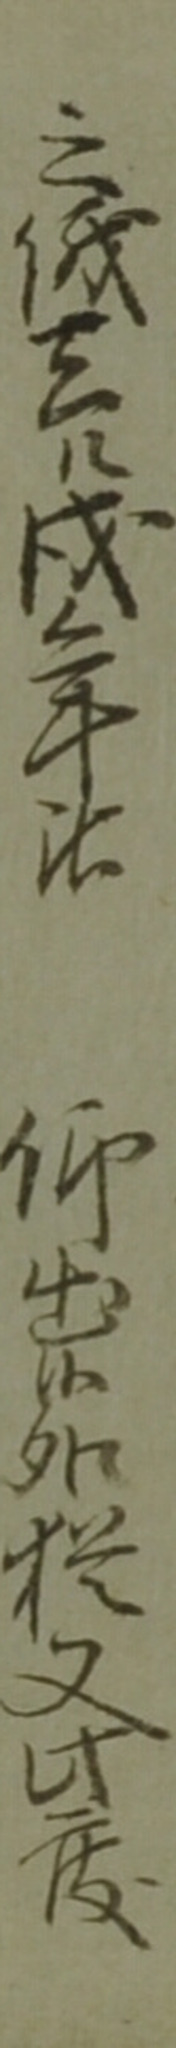之儀去ル戌年被仰出候処猶又此度
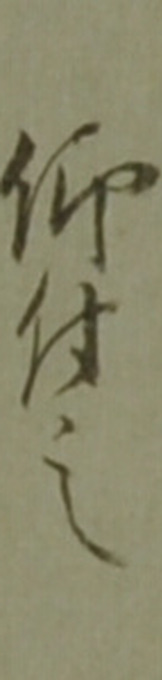仰付之
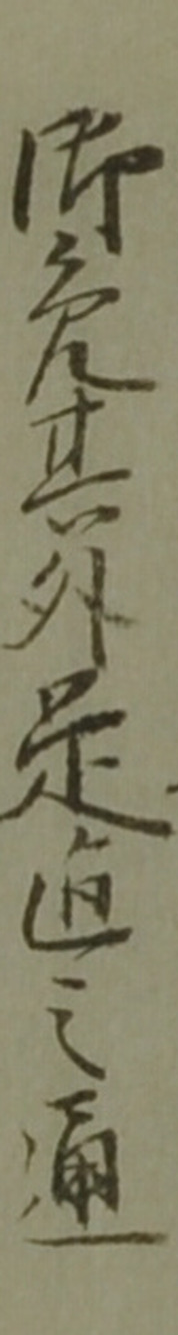御免其外是迄之通
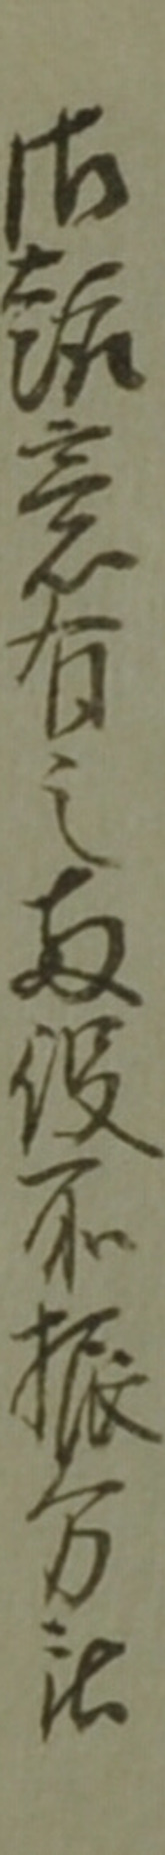御趣意有之両役取振分被
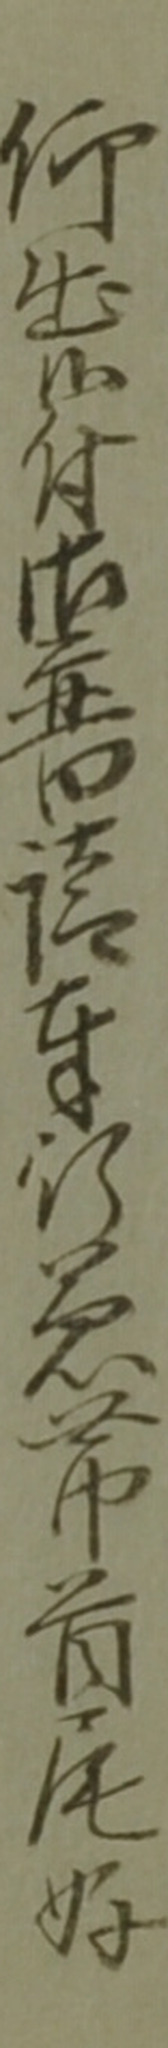仰出候付御普請奉行兼帯首尾好
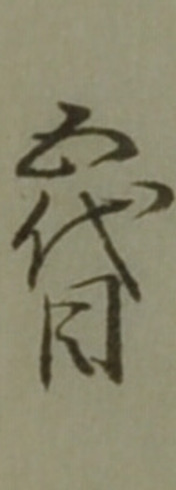五代目
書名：諸御役代々録（六）
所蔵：伊那市立高遠町図書館・合同会社AMANE
